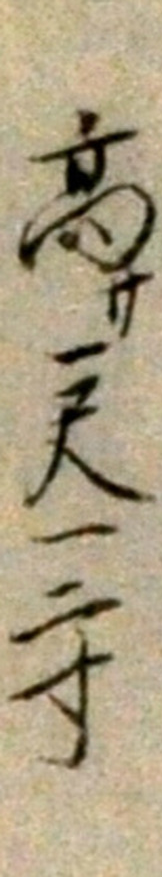高サ一尺一二寸
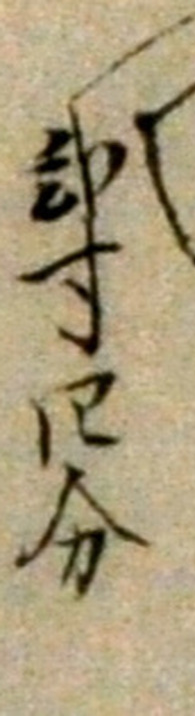弍寸四分
